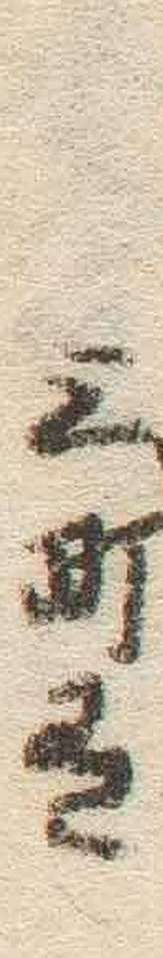三町有
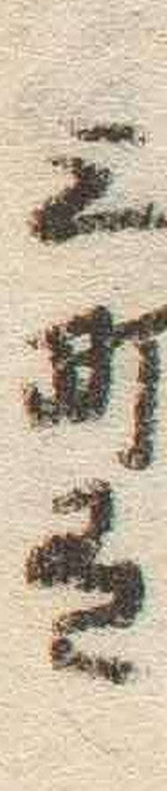三町有
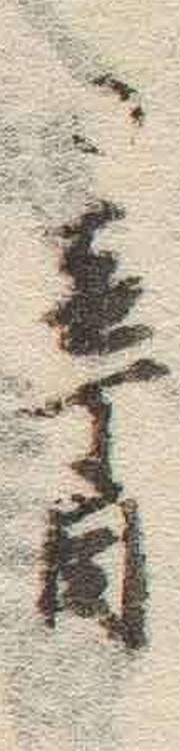○壱丁目
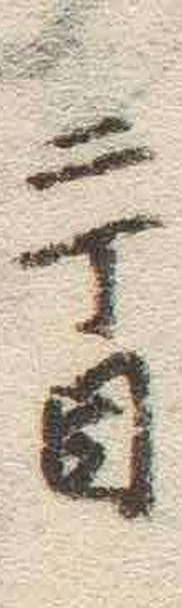二丁目
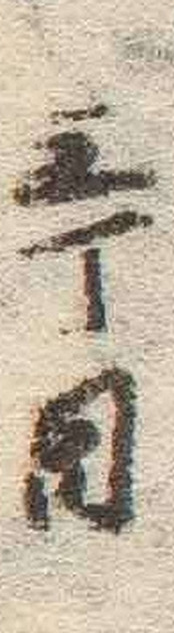三丁目
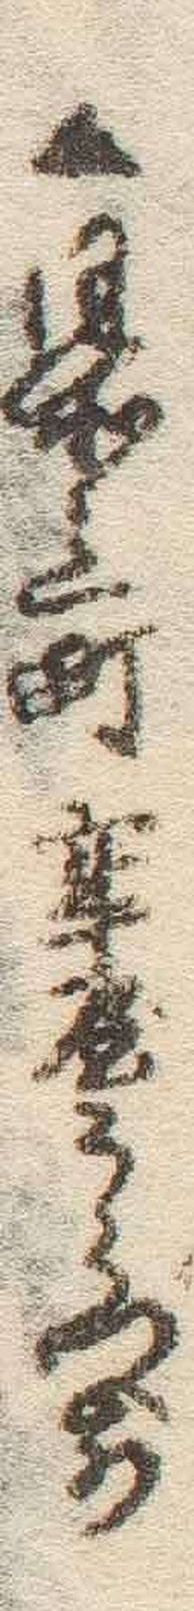▲同所上町牢屋うら門前
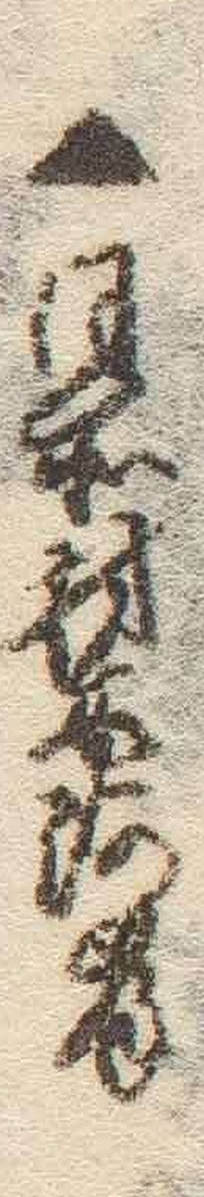▲同所材木河岸
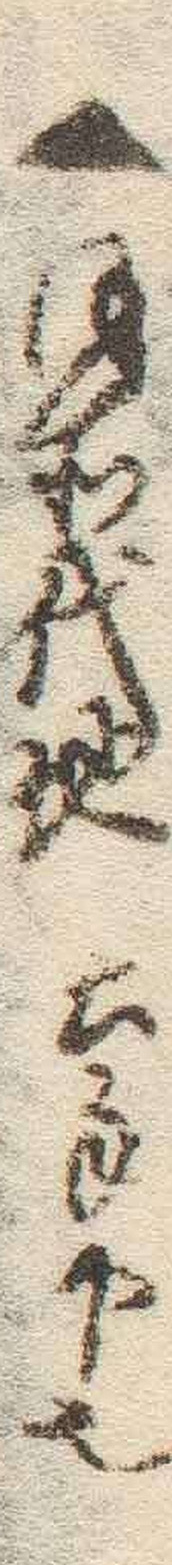▲同所代地土手下也
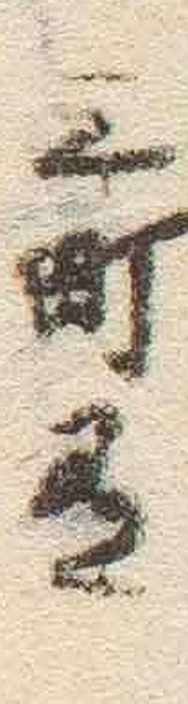三町有
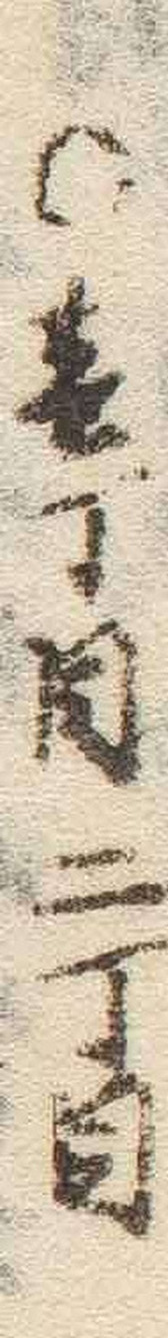○壱丁目二丁目
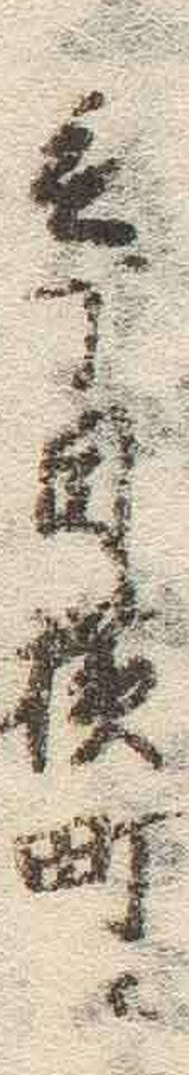壱丁目横町に
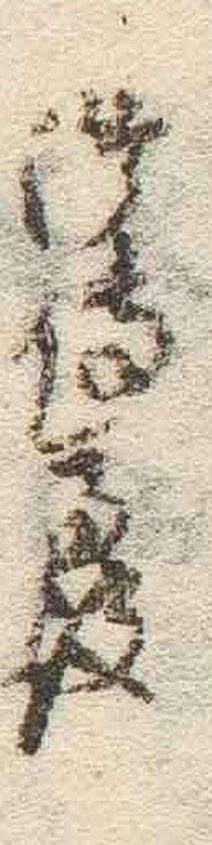御伝馬役
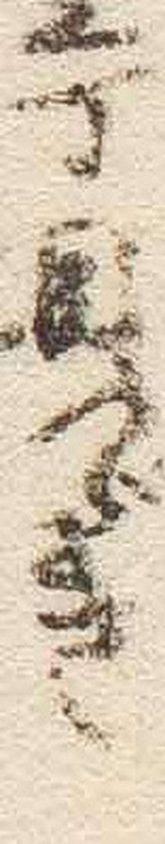瓦町つゞき
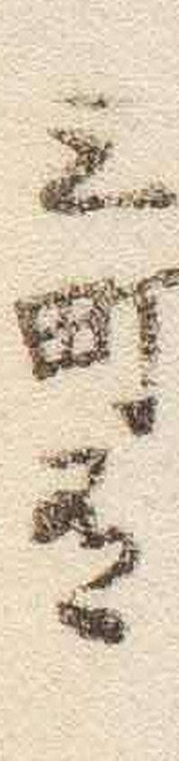三町有
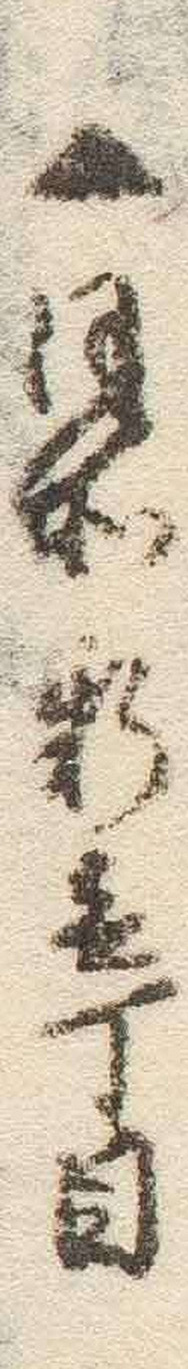▲同所新壱丁目
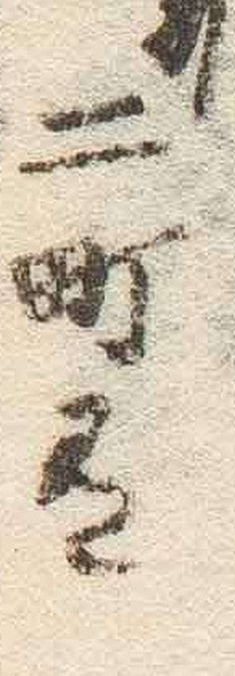二町有
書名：江戸町独案内
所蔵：東京学芸大学附属図書館 国文学研究資料館
